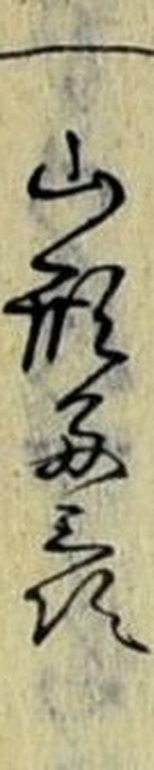山形多三郎
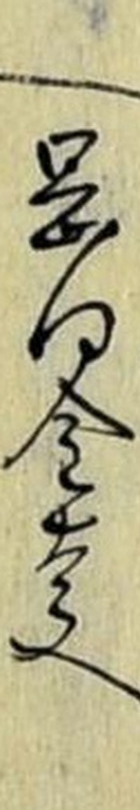岡田金太夫
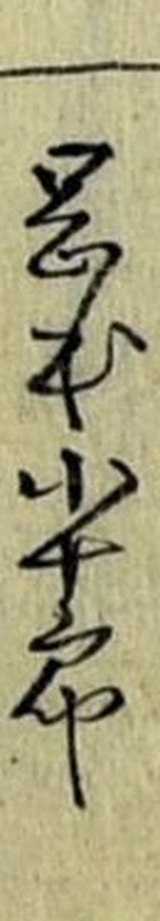岡本小十郎
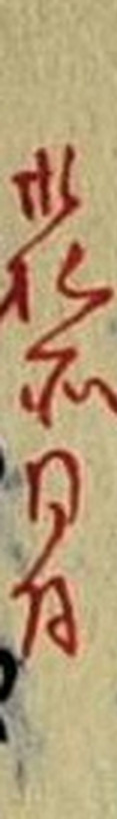御札所目付
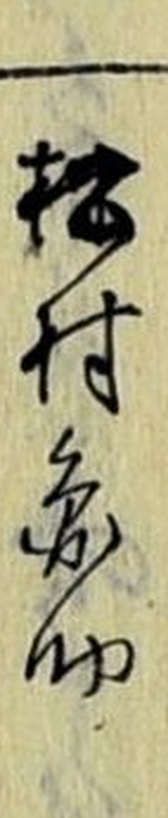植村円助
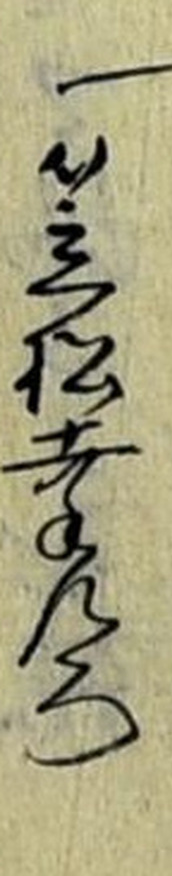笠松幸左衛門
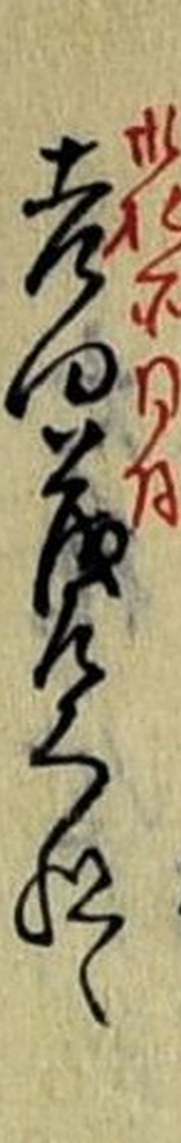吉田茂左衛門組へ
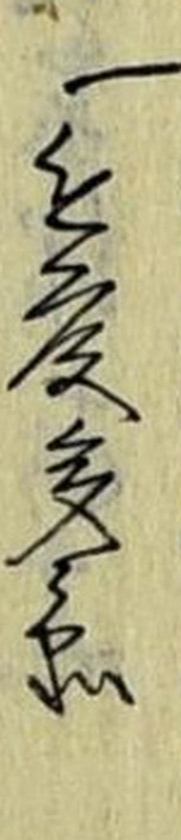近藤多兵衛
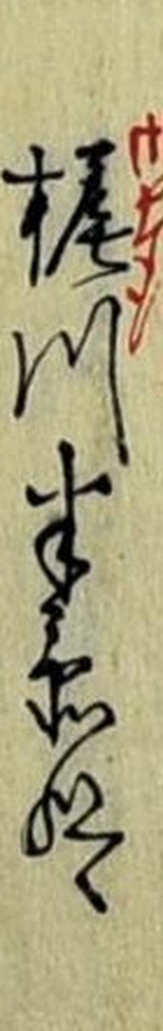梶川半兵衛組へ
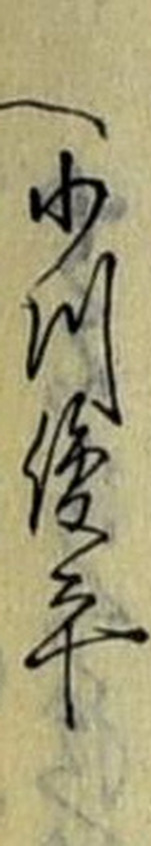小川俊平
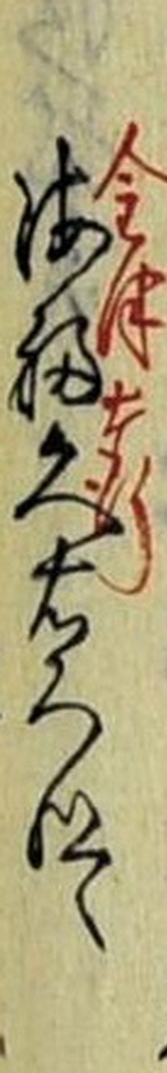海福久右衛門組へ
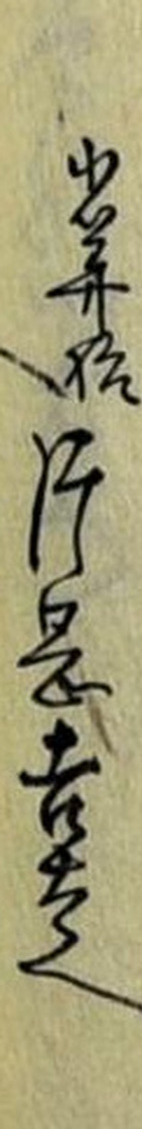小算格片岡吉太夫
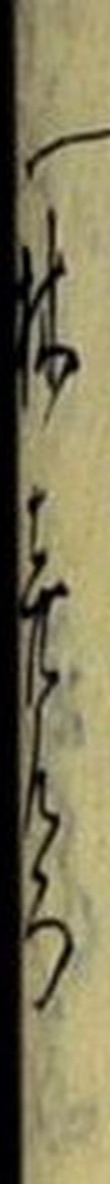林喜左衛門
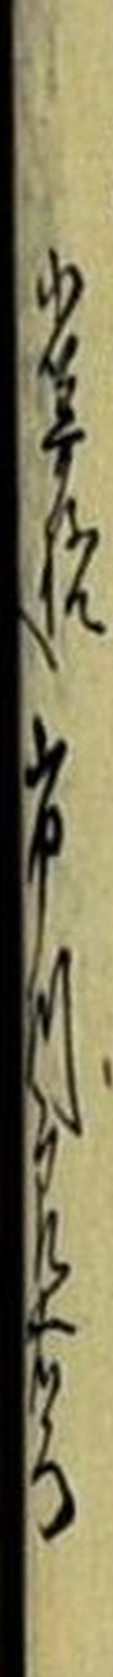小算格市川良右衛門
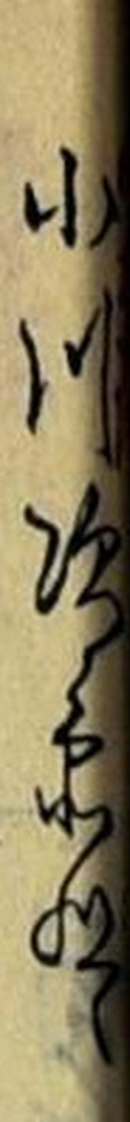小川次兵衛組へ
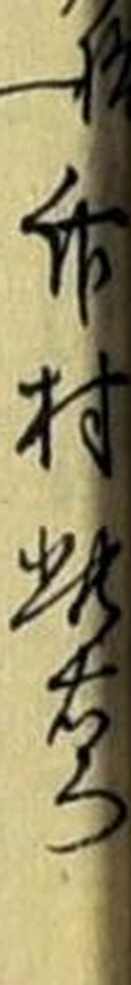玉村孫右衛門
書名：命令之部 四
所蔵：福井県文書館 Fukui Prefectural Archives
